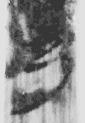乃
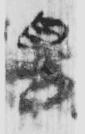眔
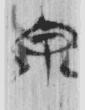余
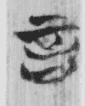言
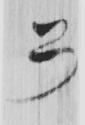乃
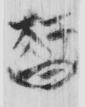智
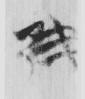隹
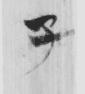子
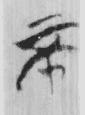不
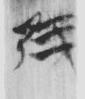隹
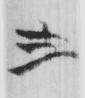之
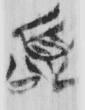頌
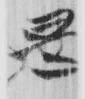是
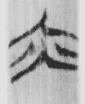亦
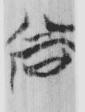尚
